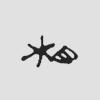相
